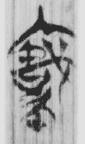{宀缄}
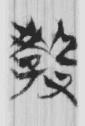教
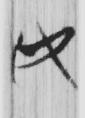女
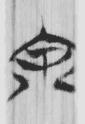余
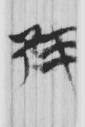隹
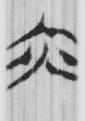亦
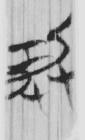{功廾}
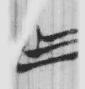乍
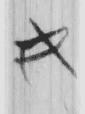女
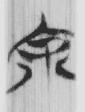余
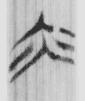亦
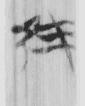隹
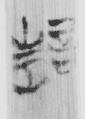{艸言}
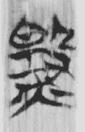{毀火}
